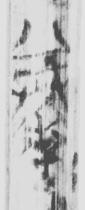拳
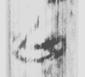㠯（以）
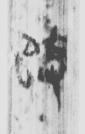{門廾}
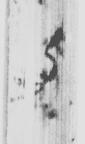此
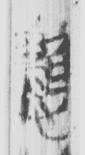戁
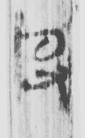沒
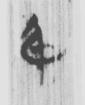身
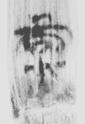{亓子}
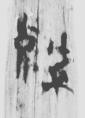殜
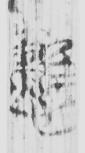戁
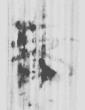不
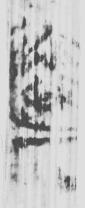{辶秦}
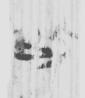此
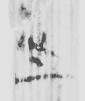之
